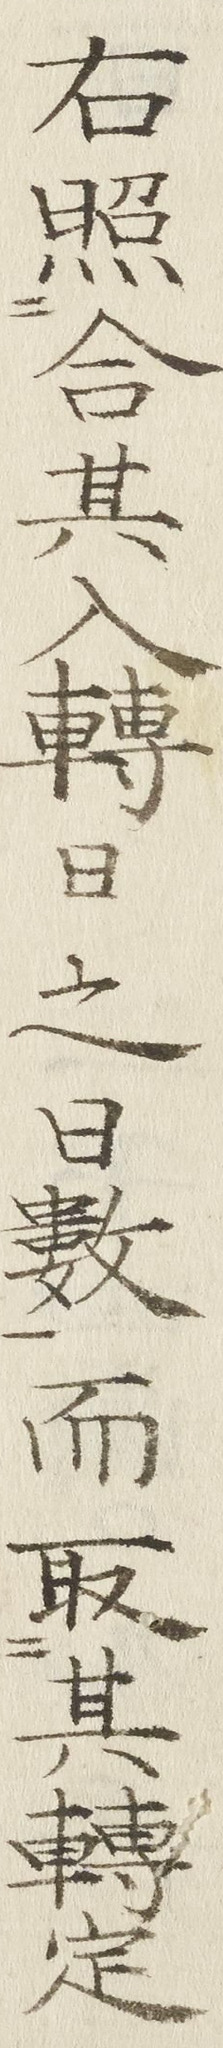右照合其入転日之日数而取其転定
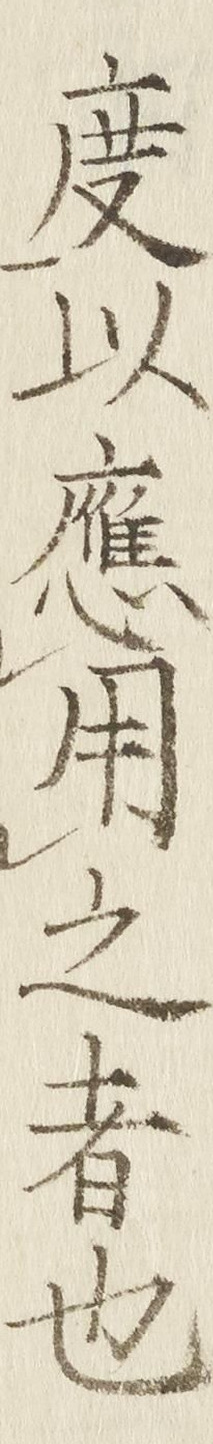度以応用之者也
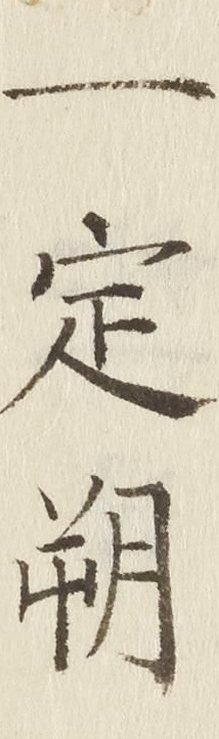一定朔
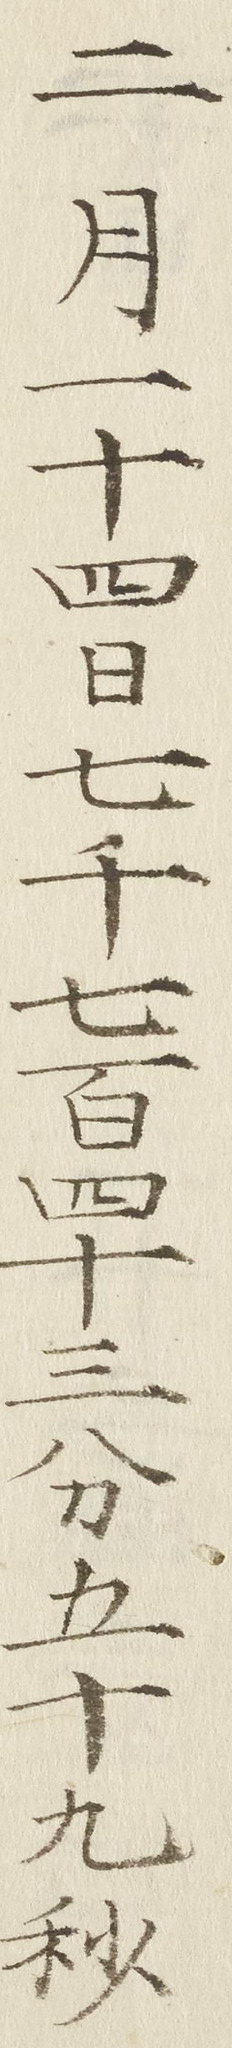二月一十四日七千七百四十三分五十九秒
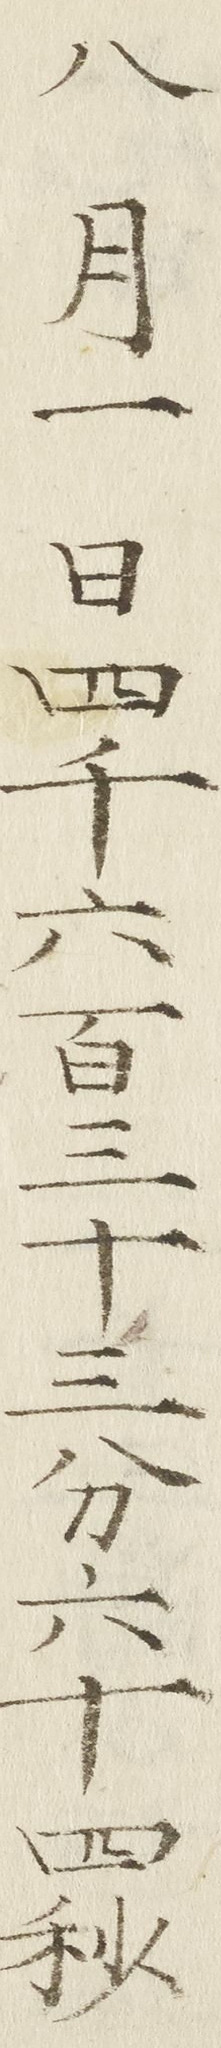八月一日四千六百三十三分六十四秒
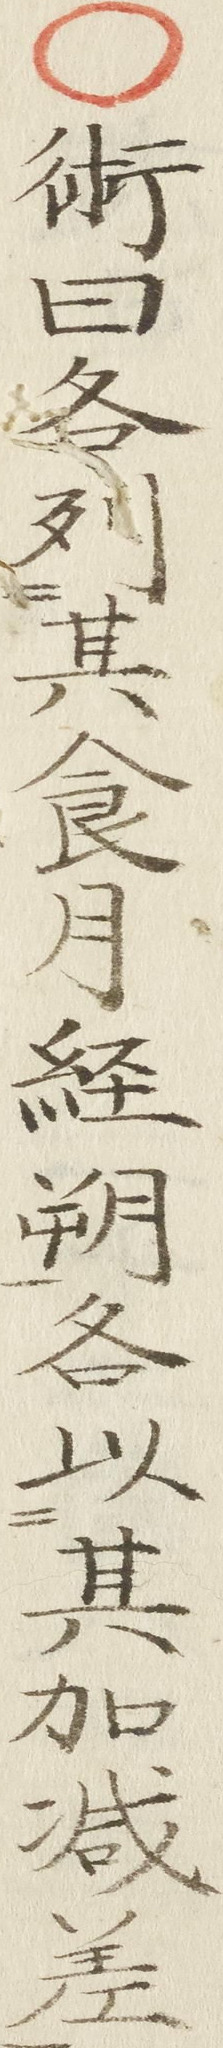○術曰各列其食月経朔各以其加減差
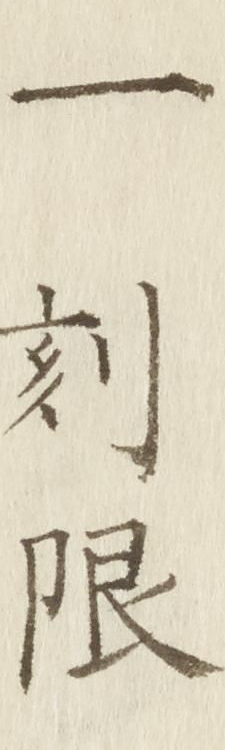一刻限
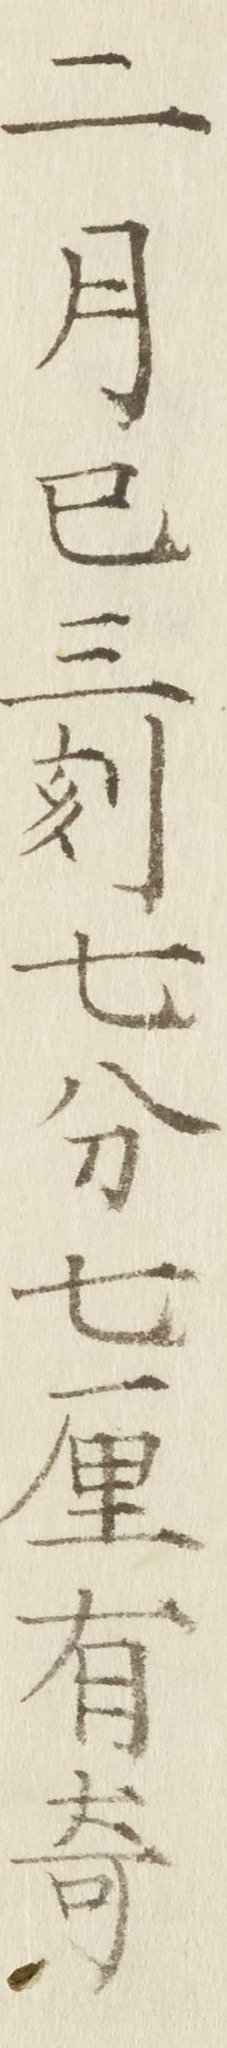二月巳三刻七分七厘有奇
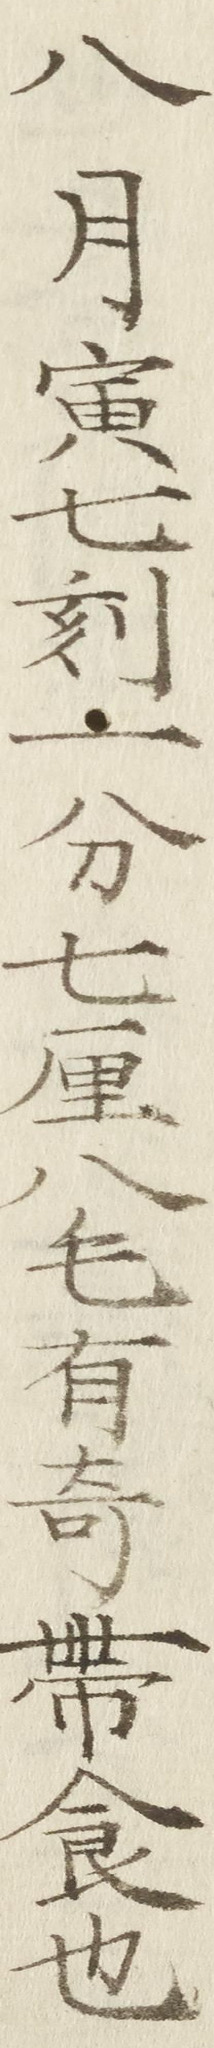八月寅七刻一分七厘八毛有奇帯食也
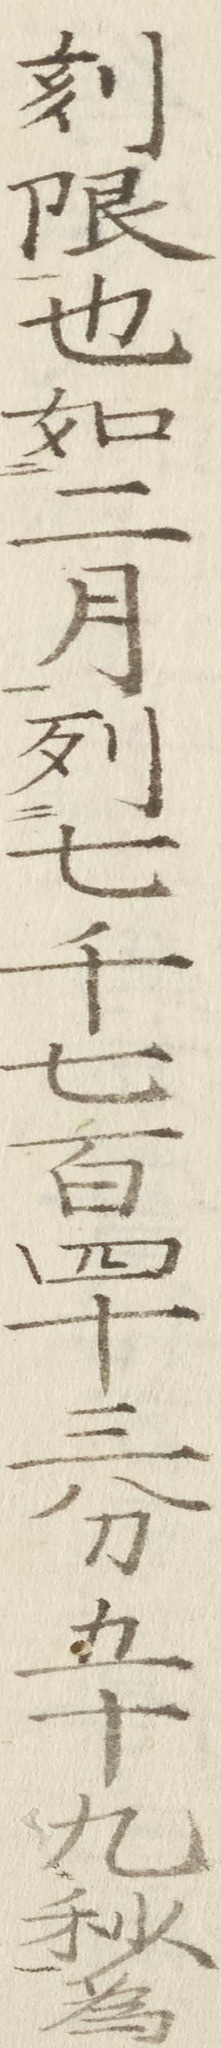刻限也如二月列七千七百四十三分五十九秒為

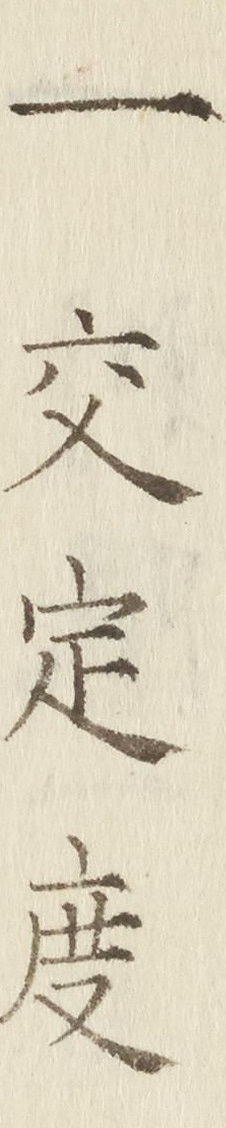一交定度
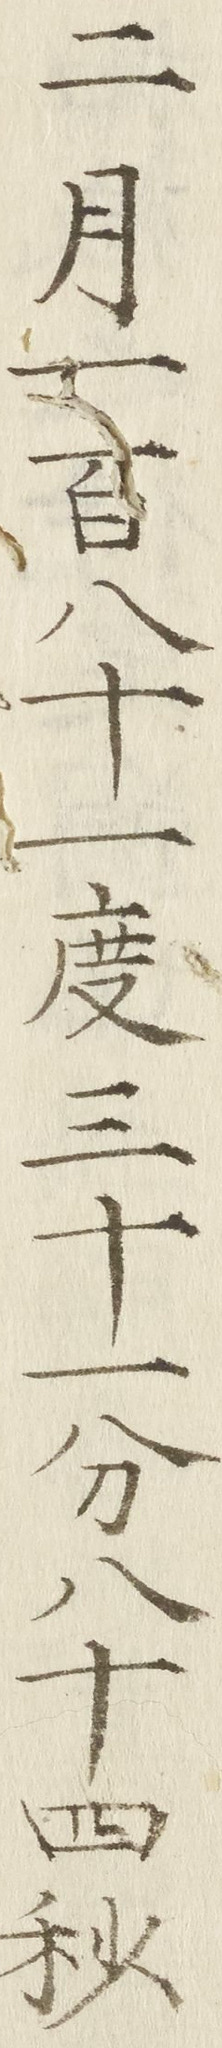二月一百八十一度三十一分八十四秒
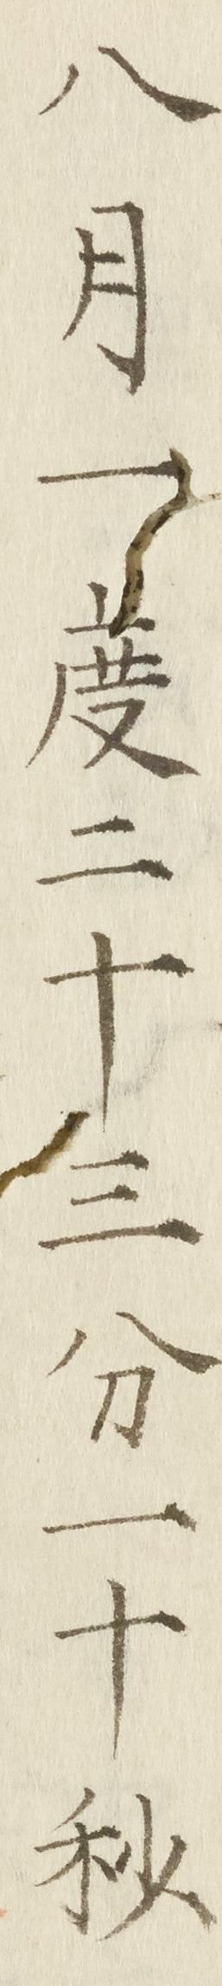八月一度二十三分一十秒
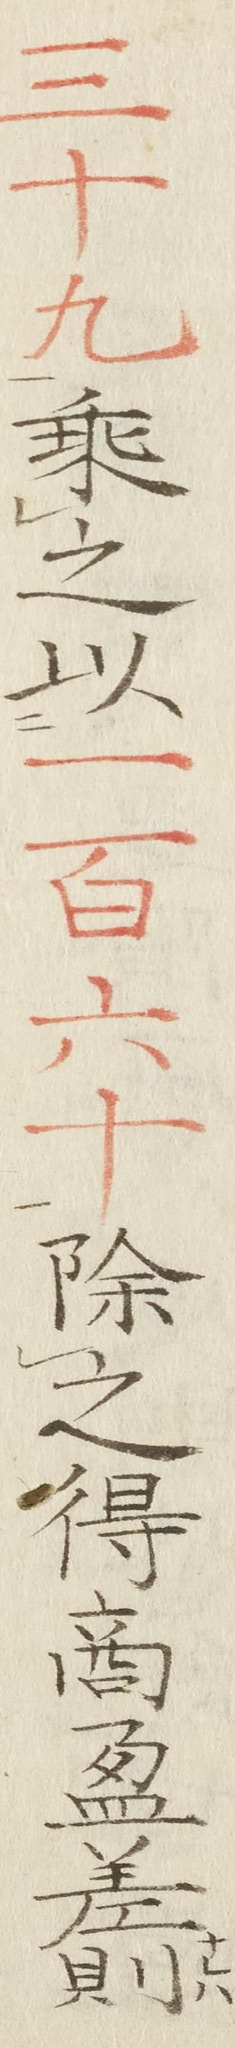三十九乗之以一百六十除之得商盈差則
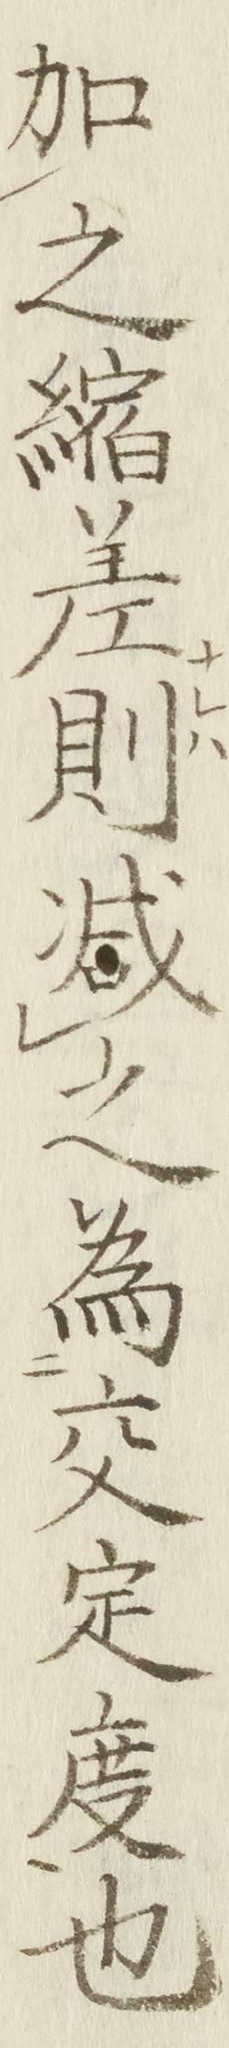加之縮差則減之為交定度也
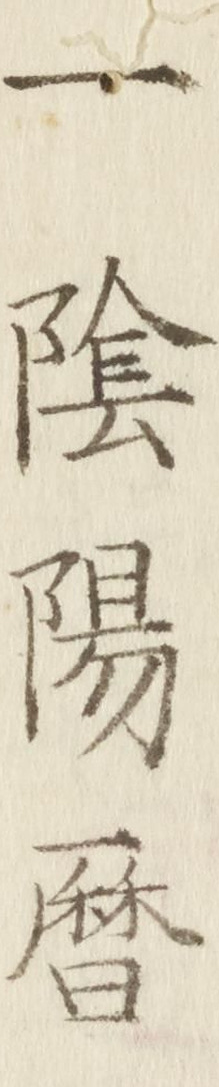一陰陽暦
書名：日食度
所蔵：東京大学地震研究所図書室 Earthquake Research Institute Library, The University of Tokyo, JAPAN
